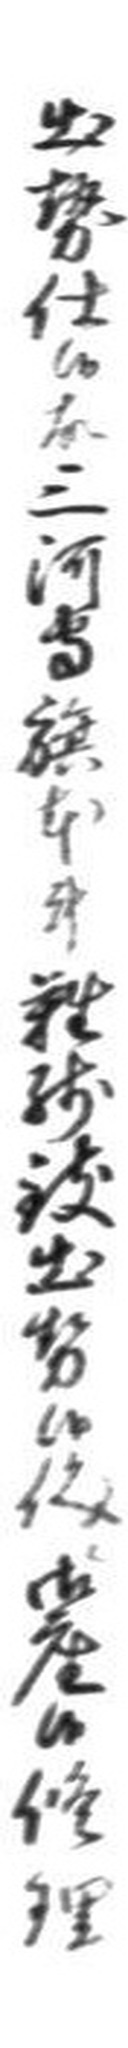出勢仕候故三河守旗本計難残致出勢候儀ニ御座候修理
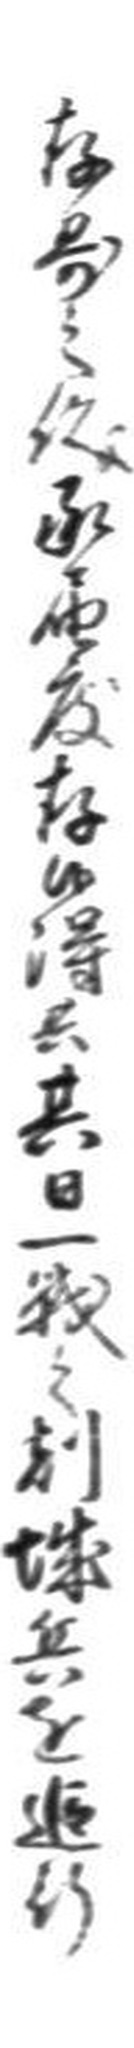存寄之儀承届度存候得共其日一戦之刻城兵を追行
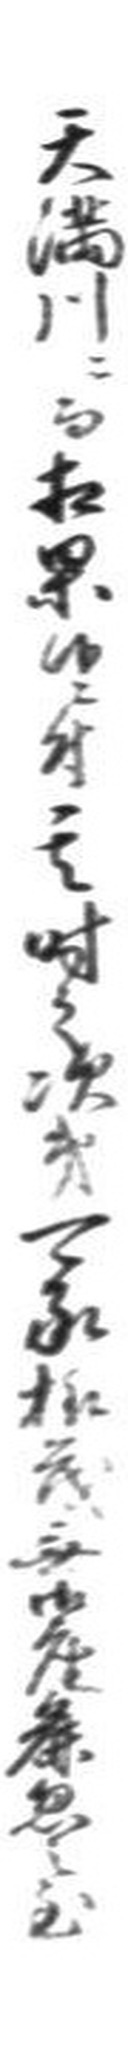天満川ニ而相果候ニ付其時之次第可承様茂無御座麁忽之至
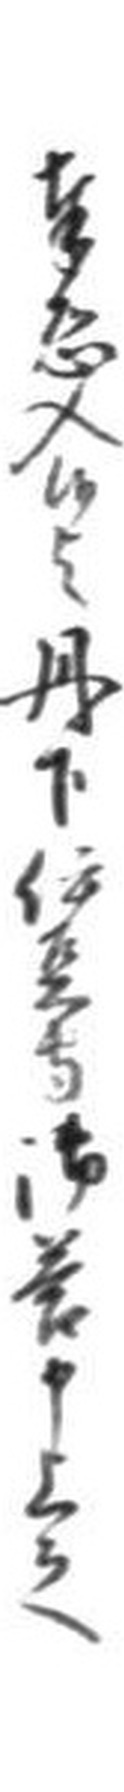奉恐入候与丹下伊豆守御答申上之
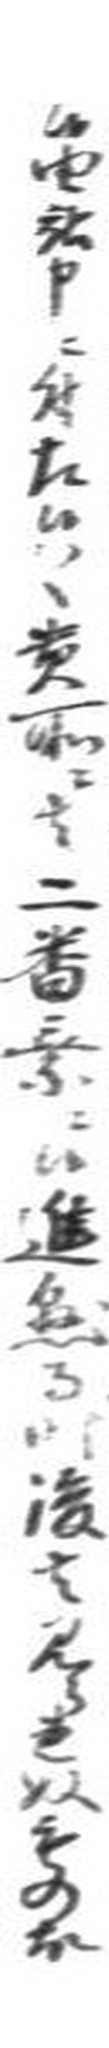候由被申ニ付左候ハヽ貴所ニ者二番乗ニ候進懸る時後者見られぬもの故

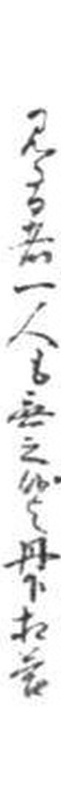見る者一人も無之候与丹下相答
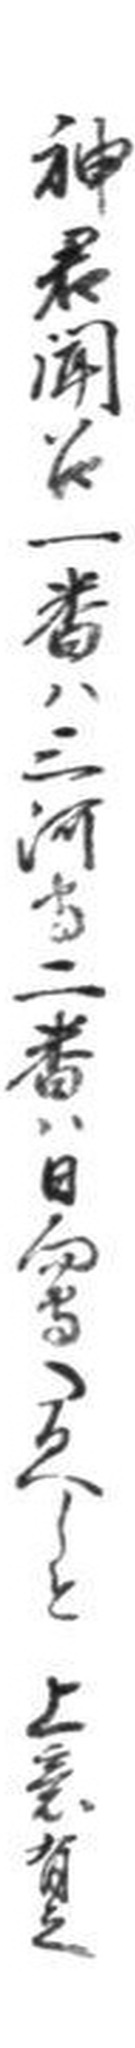神君聞召一番ハ三河守二番ハ日向守たるへしと上意有之
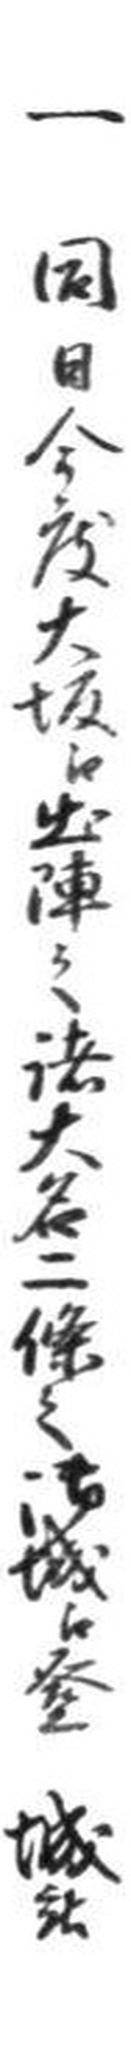一同日今度大坂江出陣之諸大名二條之御城江登城被
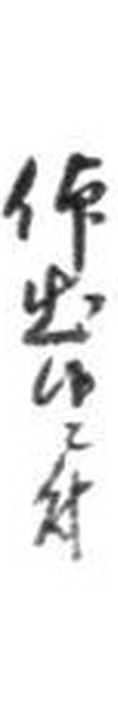仰出候ニ付
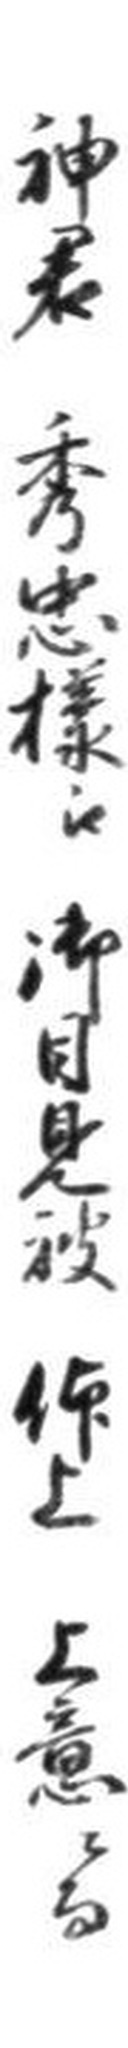神君秀忠様江御目見被仰上上意ニ而
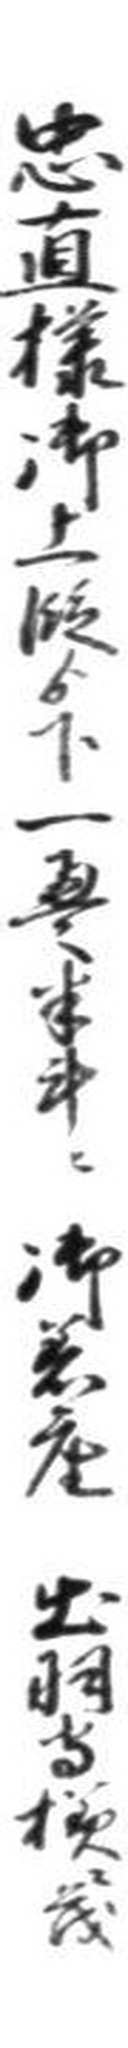忠直様御上段ゟ下一畳半計ニ御着座出羽守様ニ茂
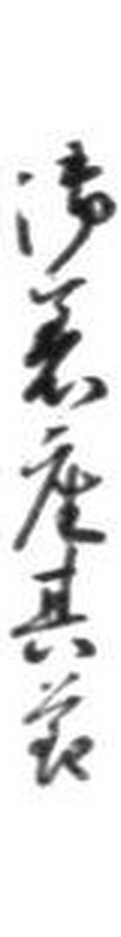御着座其節
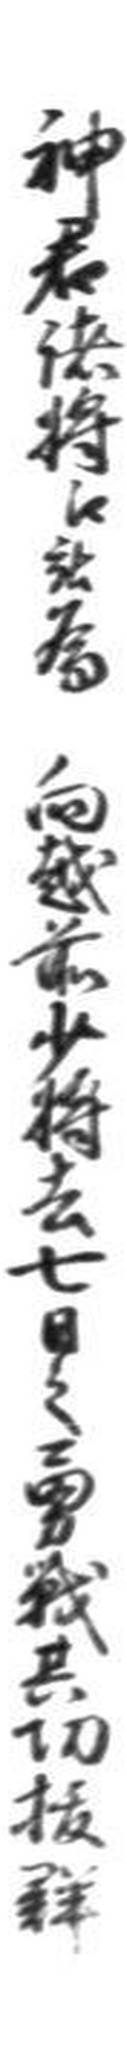神君諸将江被為向越前少将去七日之勇戦其功抜群
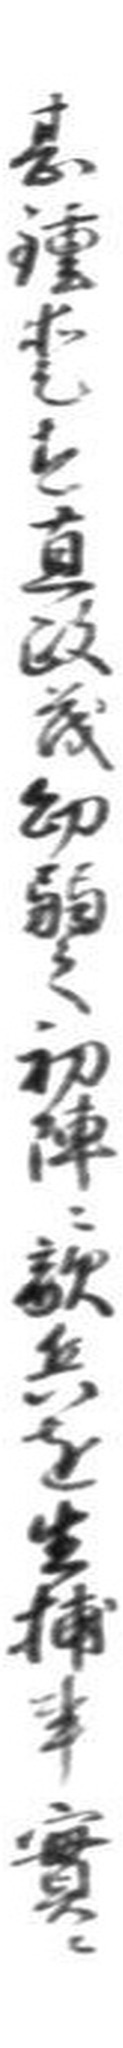甚鐘愛す直政茂幼弱之初陣ニ敵兵を生捕事実ニ
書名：家譜 二 忠直公 従文禄四年到慶安四年
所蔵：福井県文書館 Fukui Prefectural Archives
